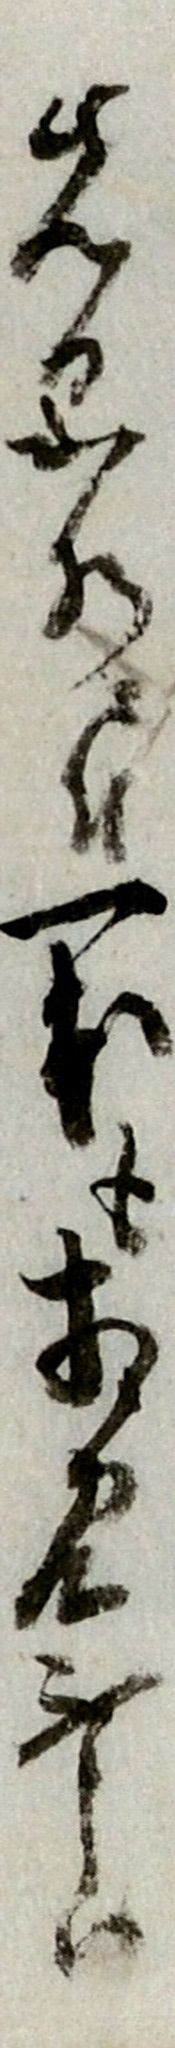先日出水ニ付一本も相見無申候
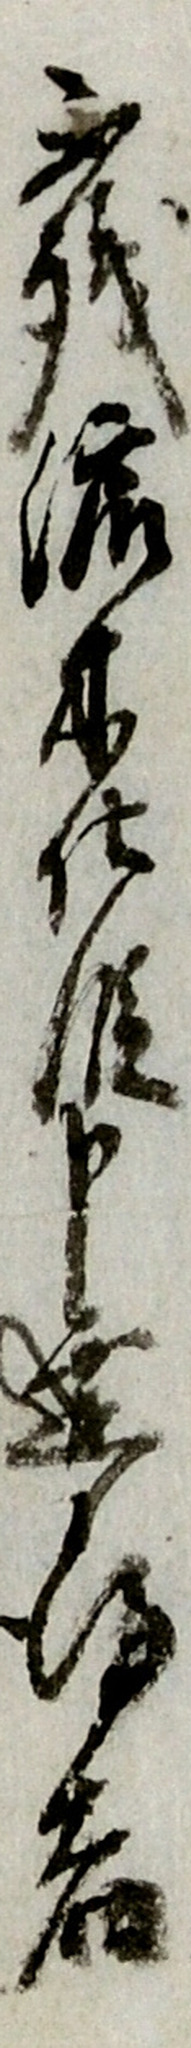不残流木仕段申達候得者
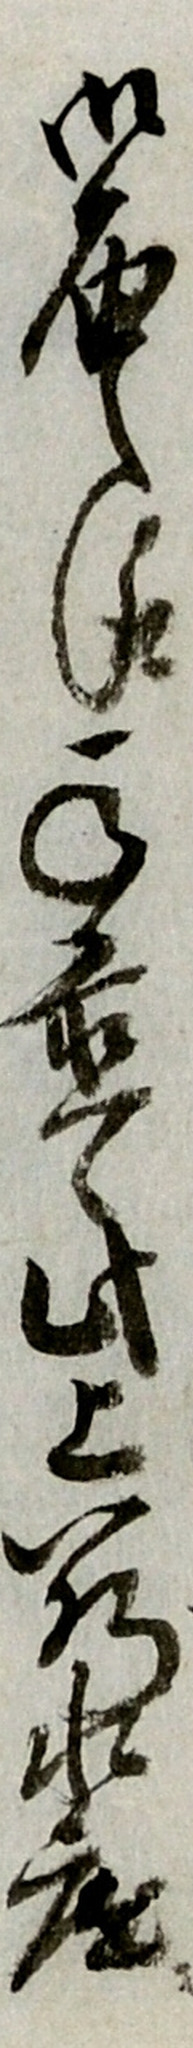御届之趣承置候此上若水底
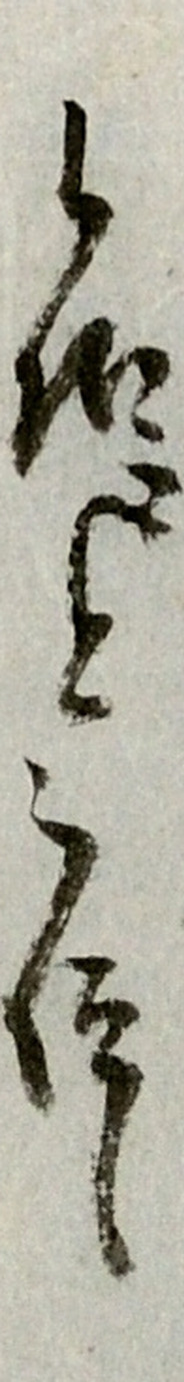候様ニと被仰候
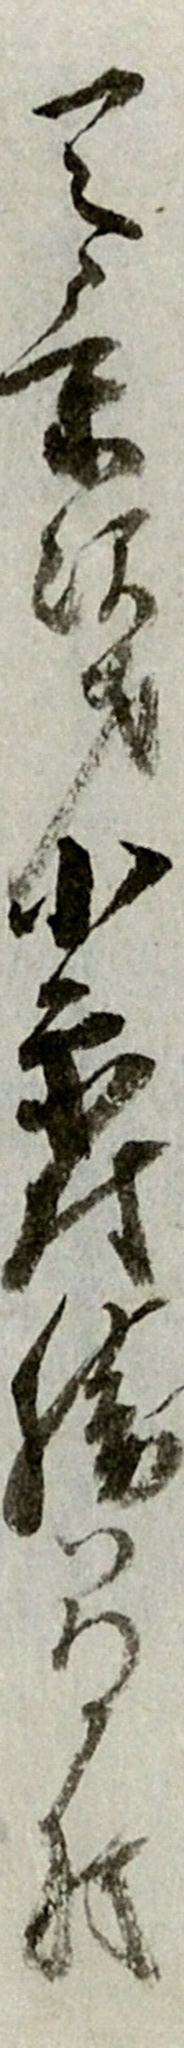天気次第小原村勝間村
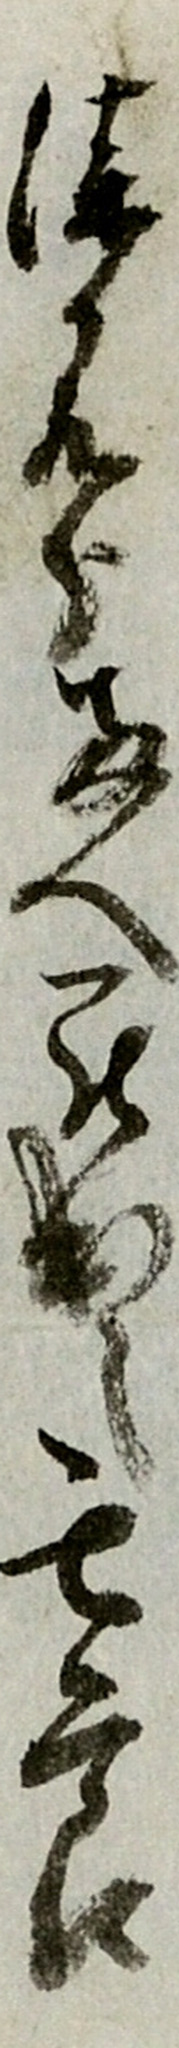漆見分両人罷出候其節
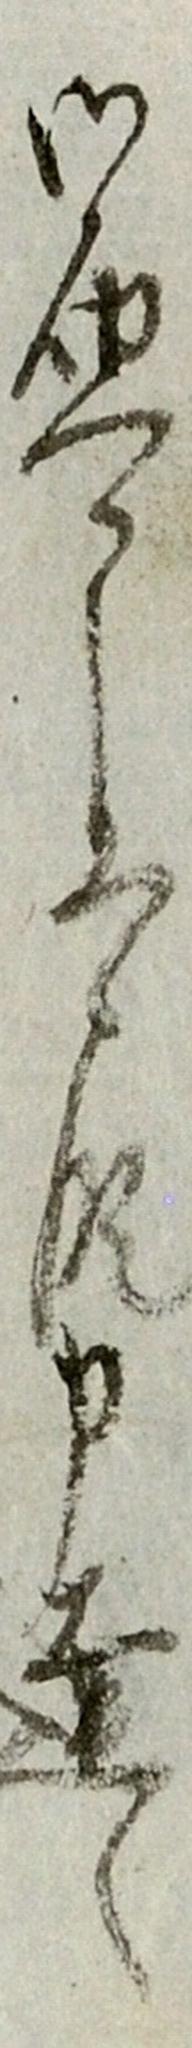御届可申上候段申達候
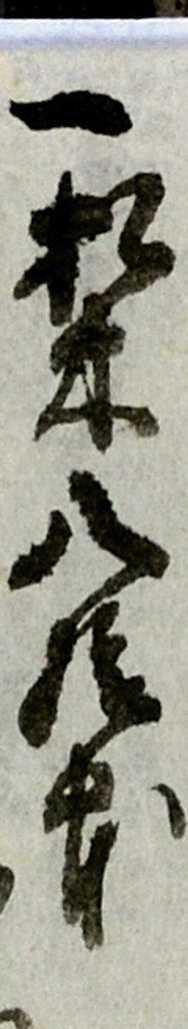一松木八拾本
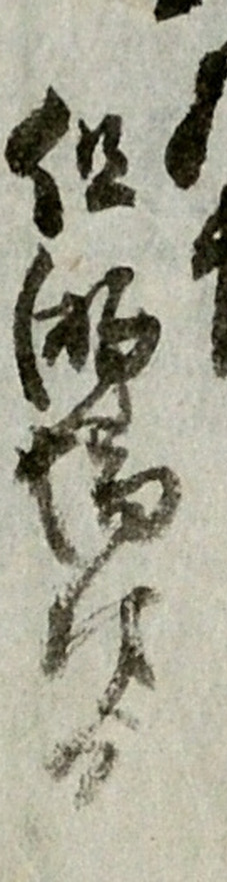但的場村ゟ
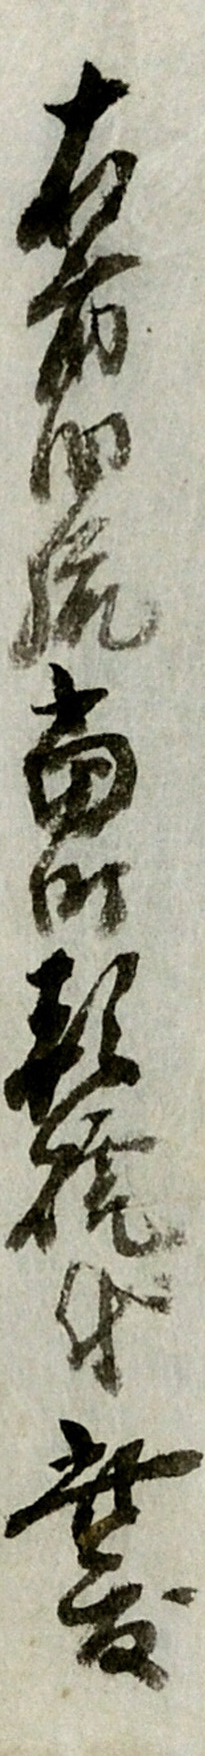右は旧臘当町類焼ニ付此度
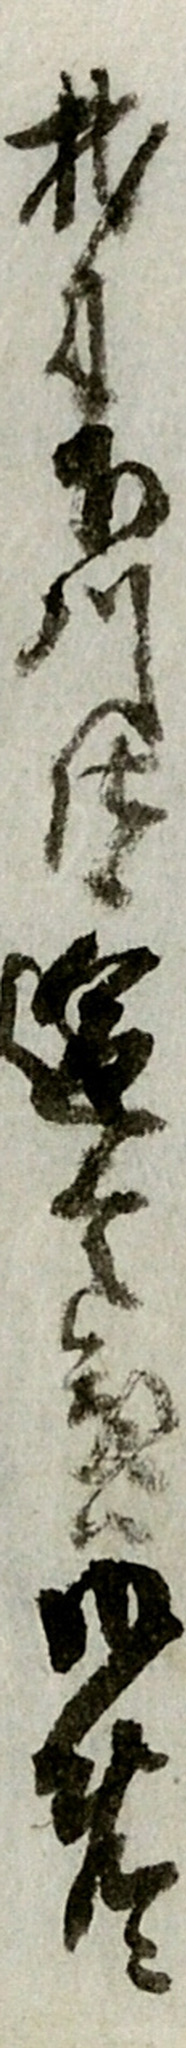材木下川仕候運上之義ハ御免ニ
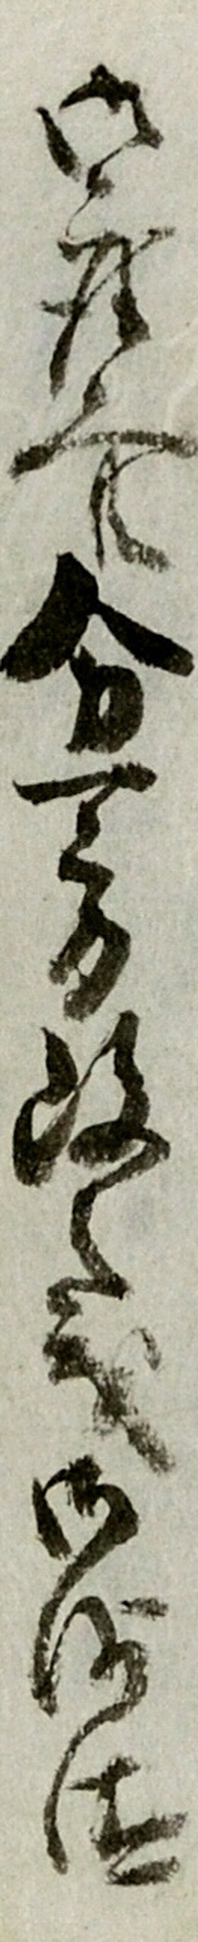御座候へ共分一方改之義御沙汰
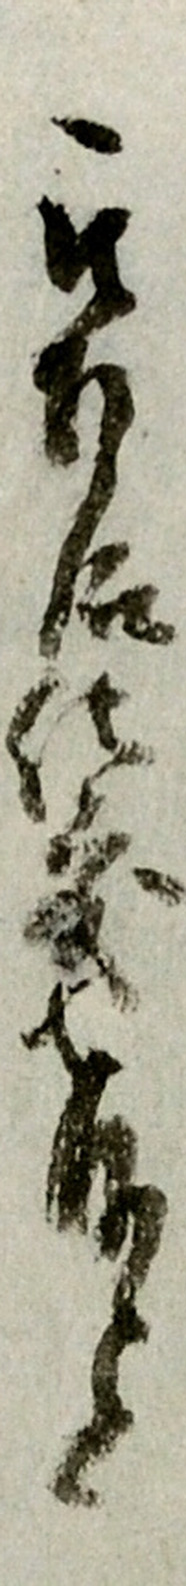被下候様仕度奉存候以上
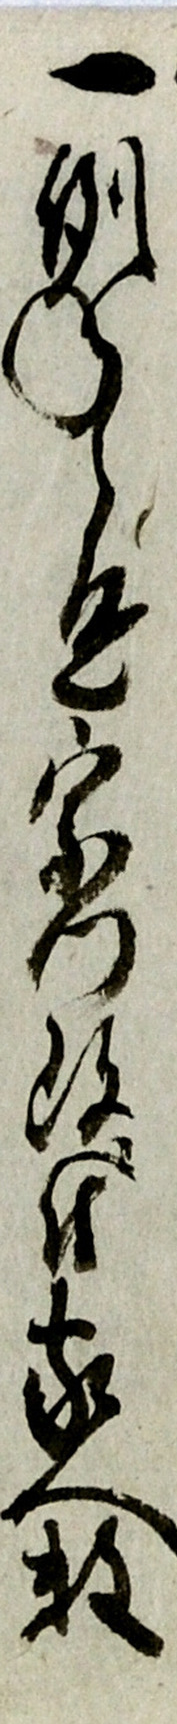一例年之通宗門改ニ付家人数
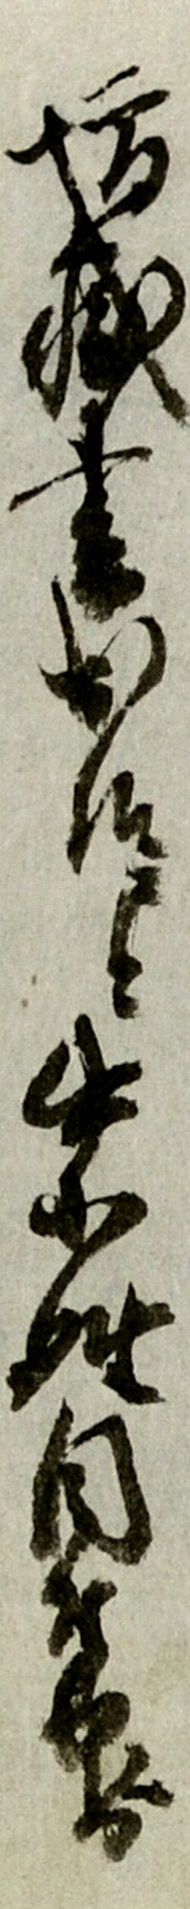増蔵書出様ニと中小姓目付中ゟ
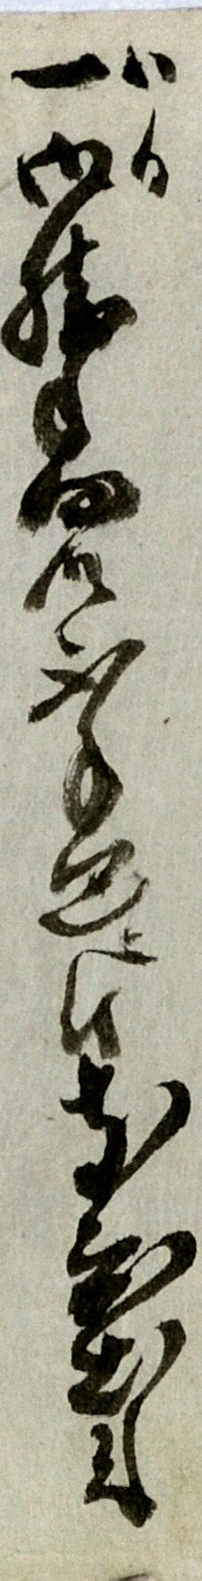一御勝手向御不手廻ニ付支度出来
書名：分一方諸事御用留帳
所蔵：伊那市立高遠町図書館・合同会社AMANE
